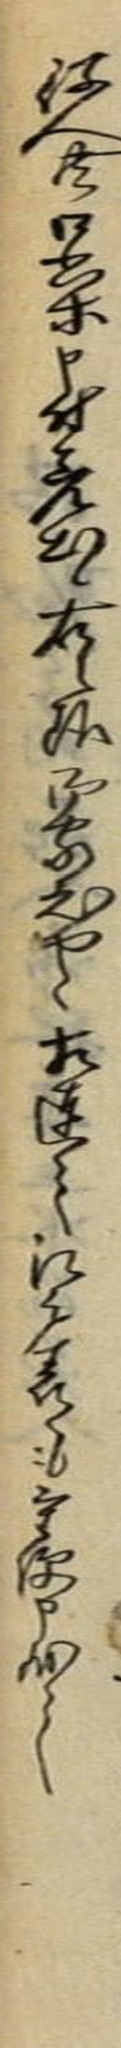役人共口書等申付差出候右之趣御家老中へ相達之江戸表へも重便申越之
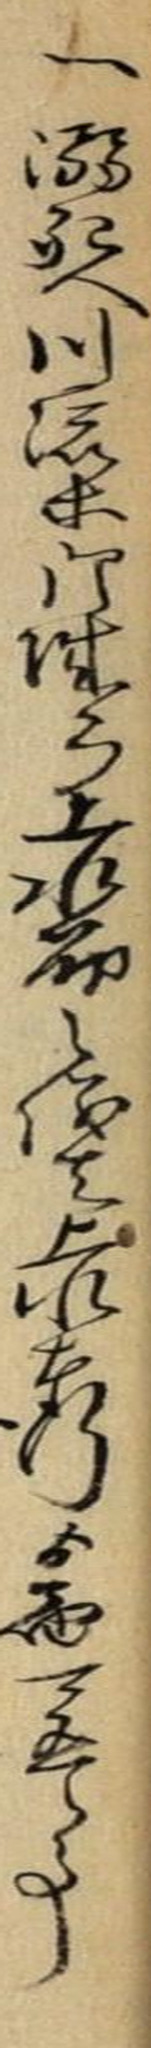一溺死人川流等御城下上水筋之儀は上水奉行ゟ届可有之事
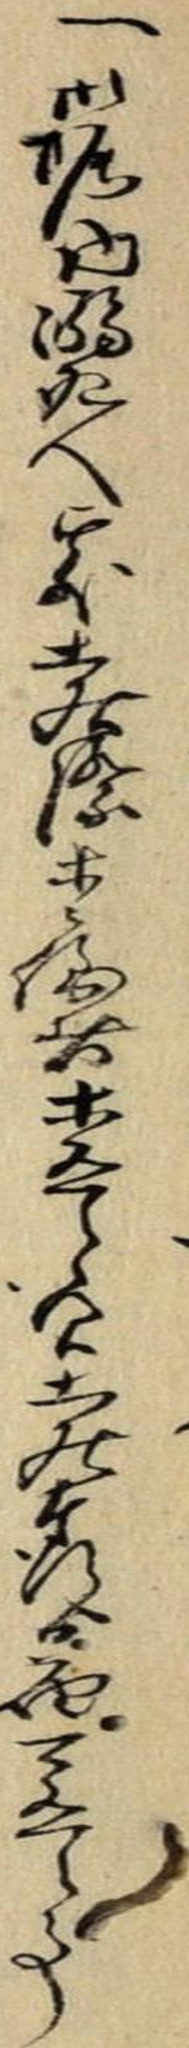一御堀内溺死人其外土居際等に倒者等有之候得は土居奉行ゟ届出可有之事
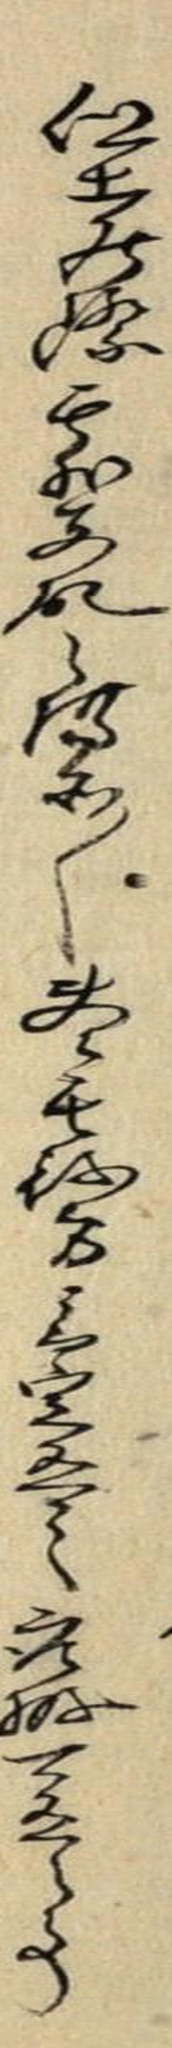但土居際其外支配之場所〳〵夫々其役方に而定有之取扱可有之事
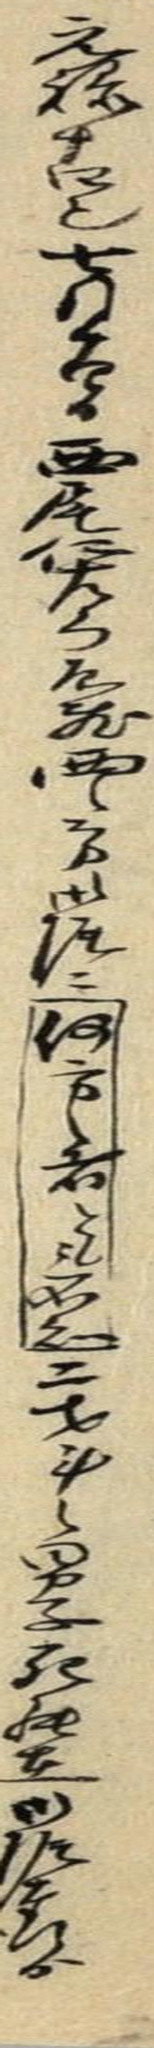一元禄十四巳七月十四日西尾仁左衛門屋敷西之方御堀に何方之者とも不知二歳斗之男子死罷在御堀奉行ゟ
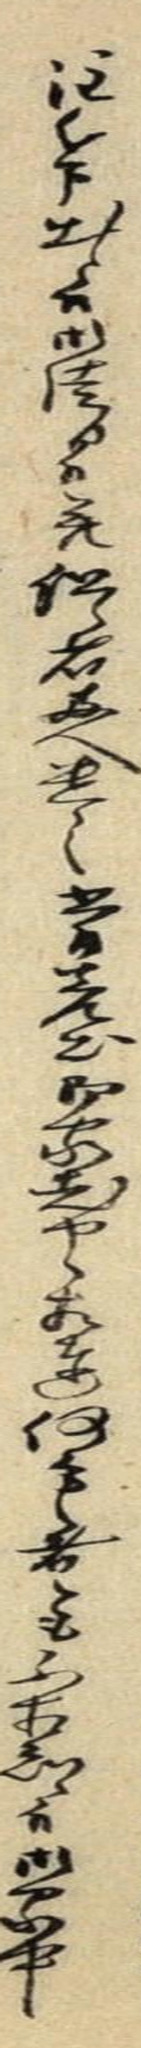注進申出候に付御徒目付并組之者両人遣之書付差出御家老中へ相達何方之者とも不相知候付御家中
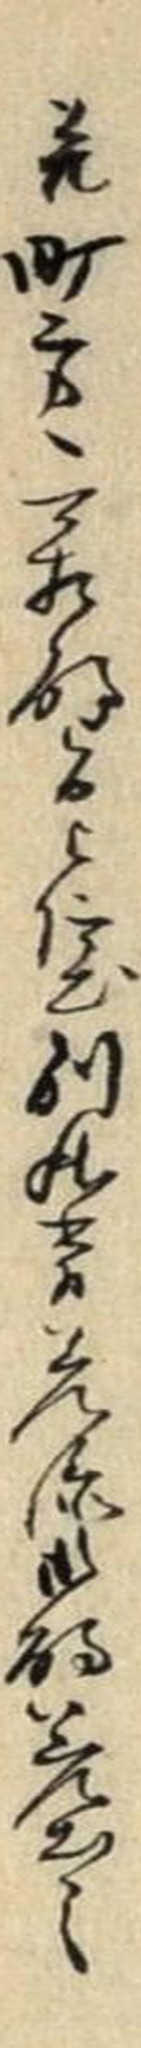并町方へ可相触旨被仰出別紙書付差添御触差出之
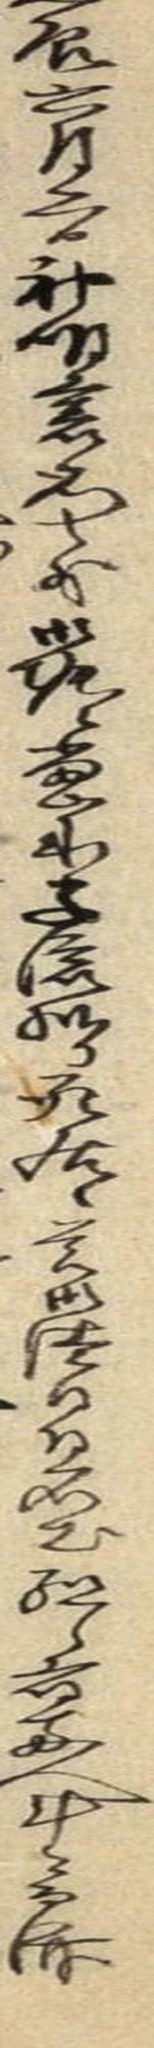一元文元辰六月二日神明裏御門之外御堀に当歳子流掛り死居候節御徒目付不出組之者両人斗に而済
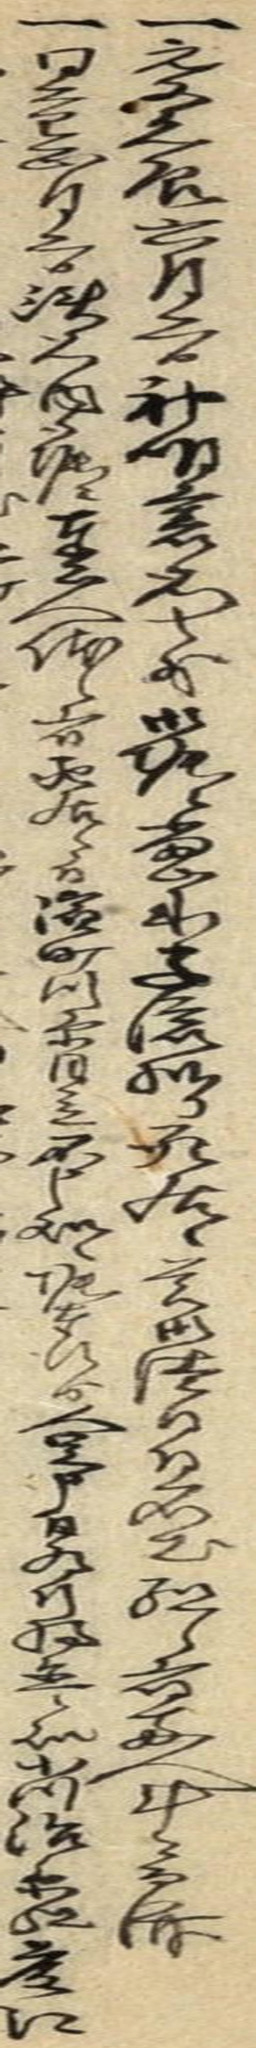一同二巳正月二日鉄御門内御堀に奉公人体之者死居候に付浜町川原目立不申処へ堀奉行ゟ人足申付為引揚置候処小川治兵衛組藤江
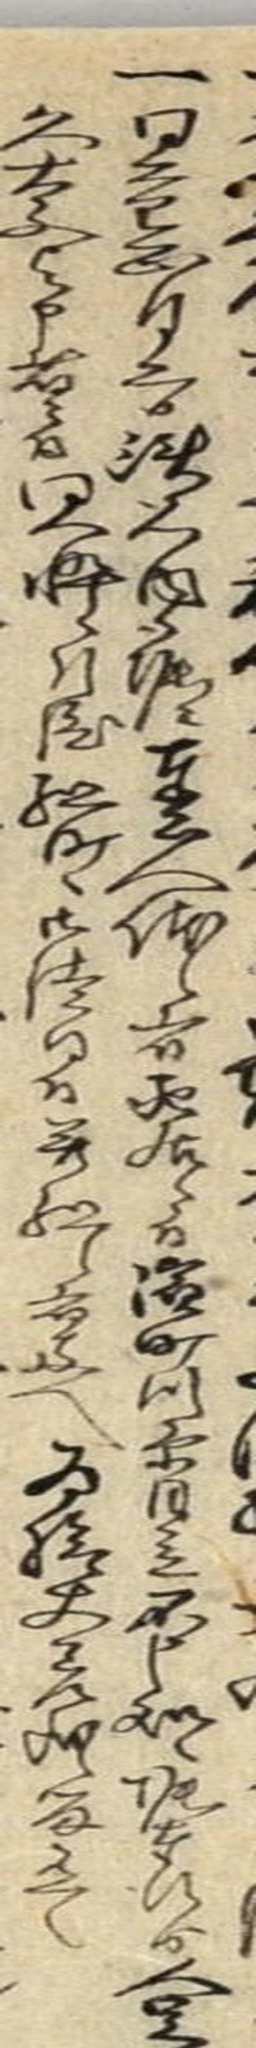久大夫と申者に付同人倅へ引渡組町へ御徒目付并組之者両人為検使差越候留有之
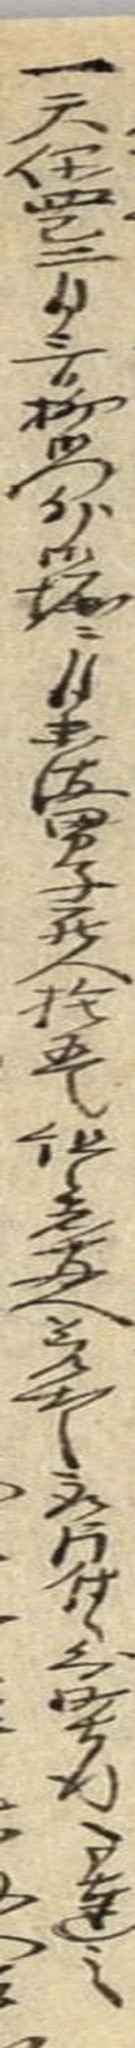一天保四巳二月三日柳御門外御堀に月未満男子死人捨有之組之者両人差出し取片付候義町奉行へ申達之
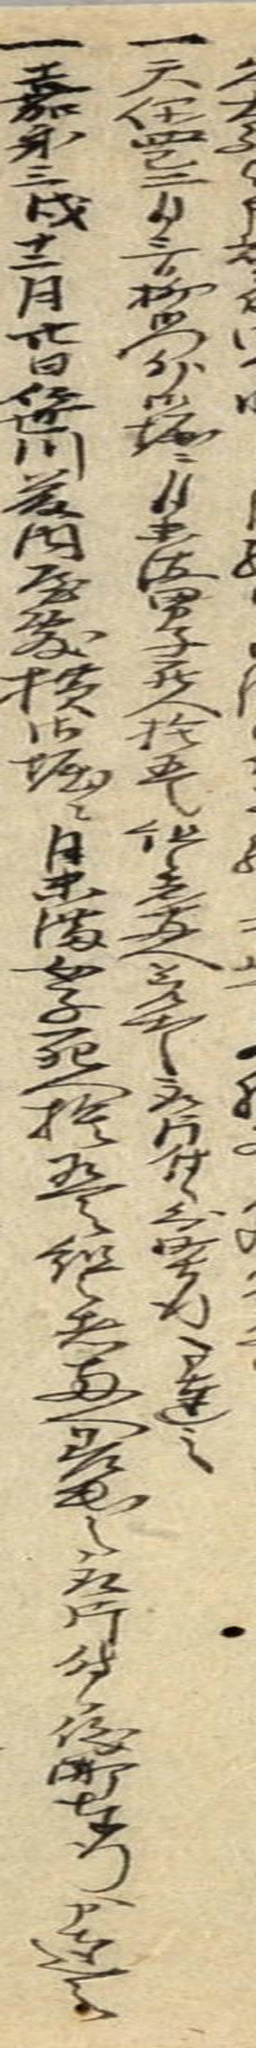一嘉永三戌十二月廿日笹川藤内屋敷横御堀に月未満女子死人捨有之組之者両人差出之取片付候儀町奉行へ申達事之
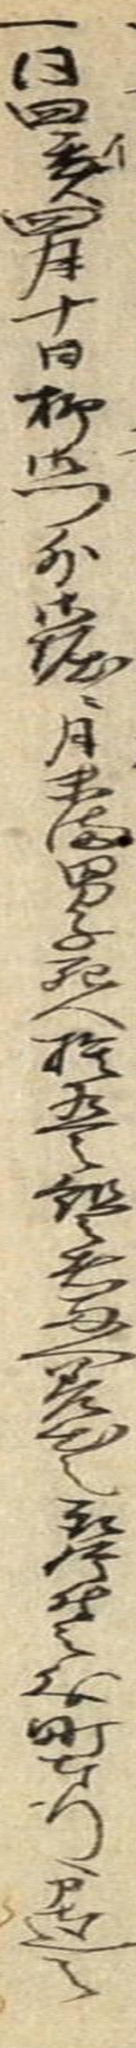一同四亥四月十日柳御門外御堀に月未満男子死人捨有之組之者両人差出之取片付之義町奉行へ申達之

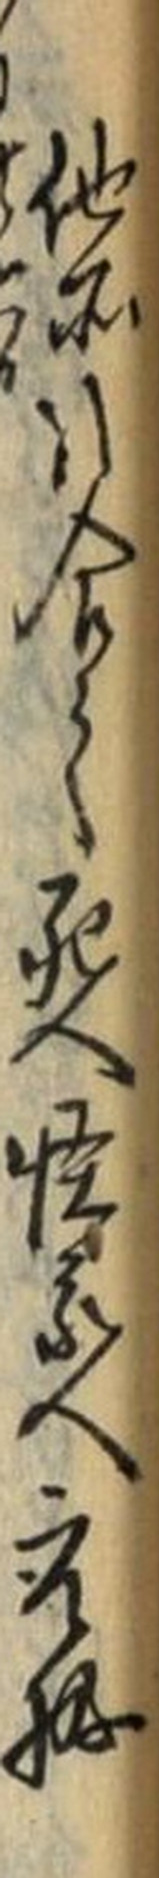他所引合之死人怪我人取扱
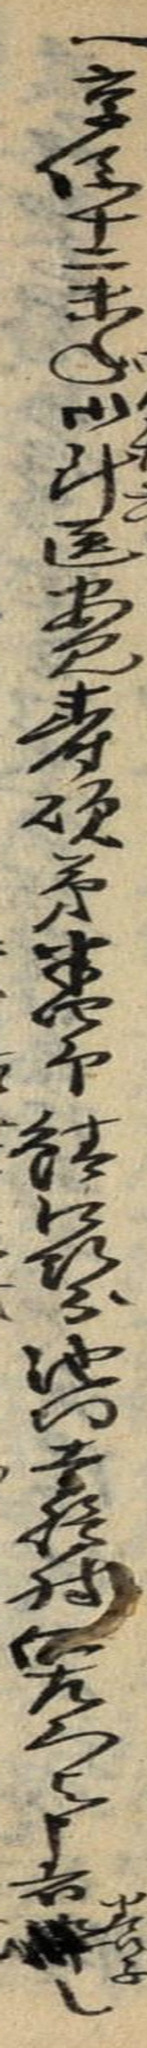一享保十二未年御針医四月廿六日安見寿碩弟半次郎鯖江領分池田寺嶋村仁左衛門と申者養子の
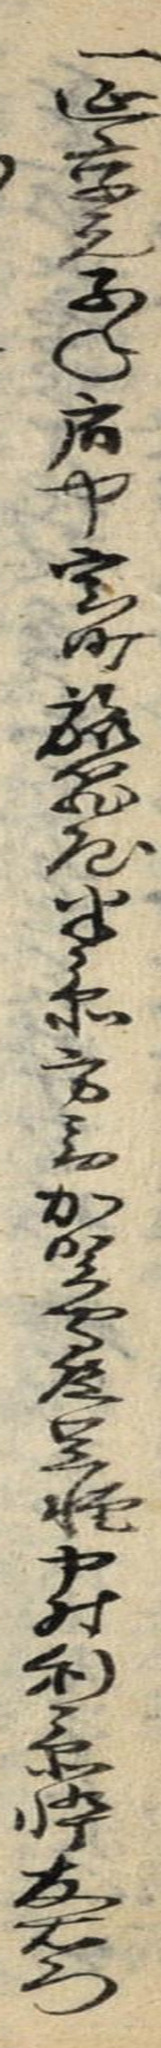一延享元子年府中宝町旅籠屋半兵衛方に而加賀守殿足軽中村利兵衛倅友右衛門
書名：御停止異変死失
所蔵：福井県文書館 Fukui Prefectural Archives
